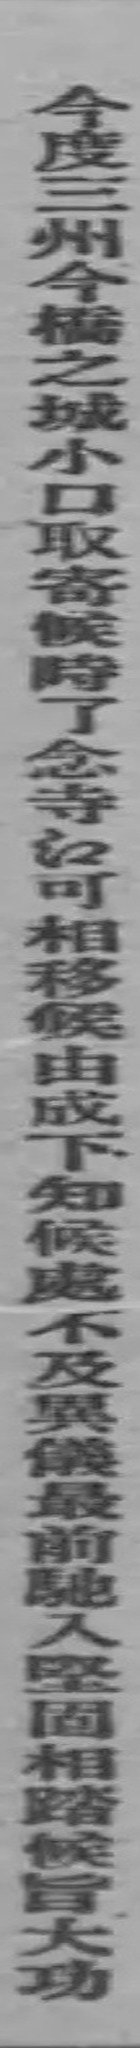今度三州今橋之城小口取寄候時了念寺え可相移候由成下知候処不及異儀最前馳入堅固相踏候旨大功
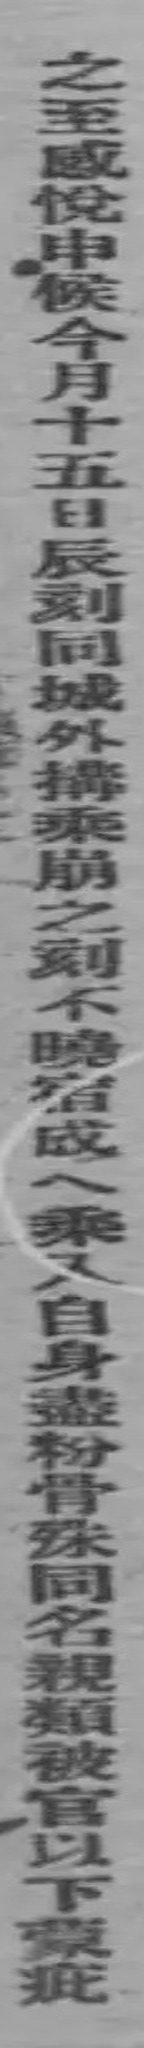之至感悦申候今月十五日辰刻同城外搆乗崩之刻不暁宿成へ乗入自身盡粉骨殊同名親類被官以下蒙疵

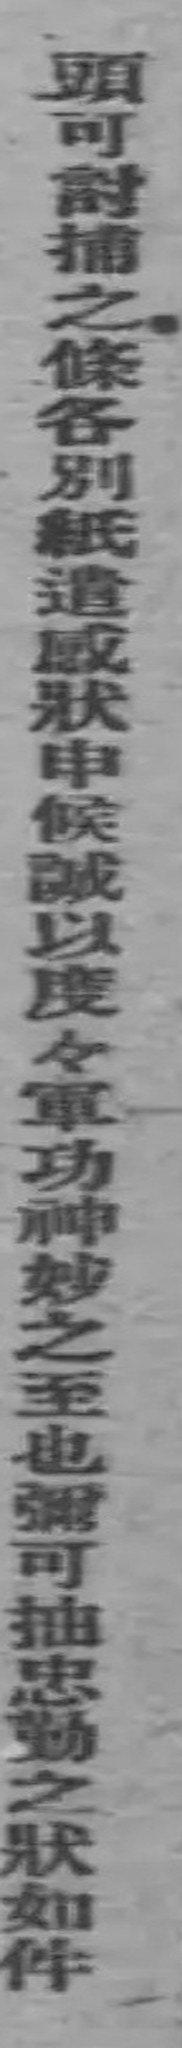頭可討捕之條各別紙遣感状申候誠以度々軍功神妙之至也弥可抽忠勤之状如件
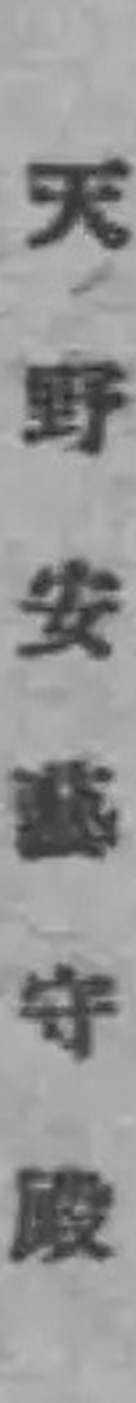天野安芸守殿
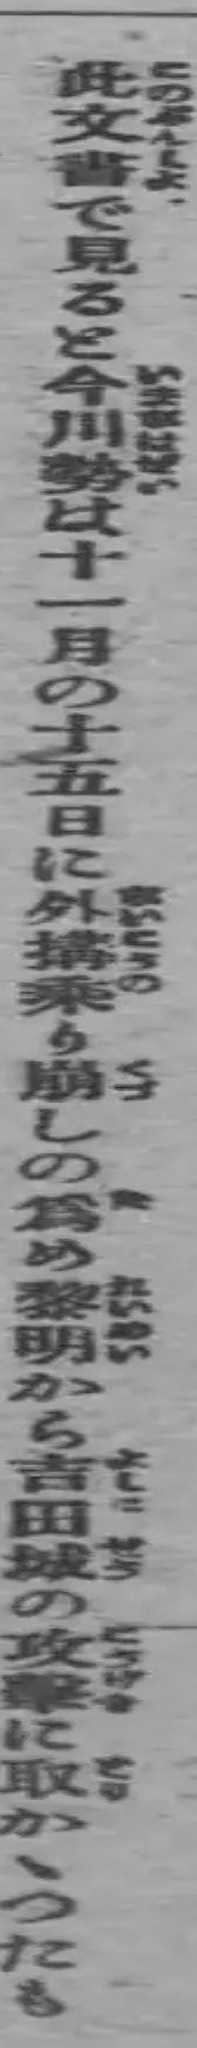此文書で見ると今川勢は十一月の十五日に外搆乗り崩しの為め黎明から吉田城の攻撃に取かゝつたも
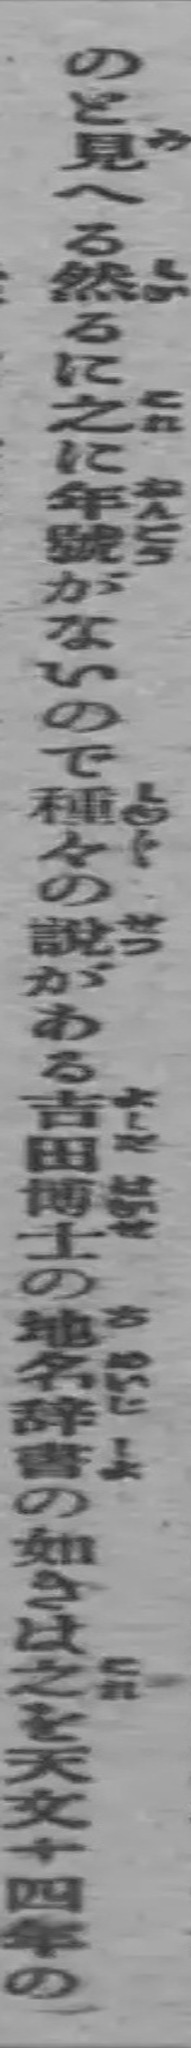のと見へる然るに之に年号がないので種々の説がある吉田博士の地名辞書の如きは之を天文十四年の
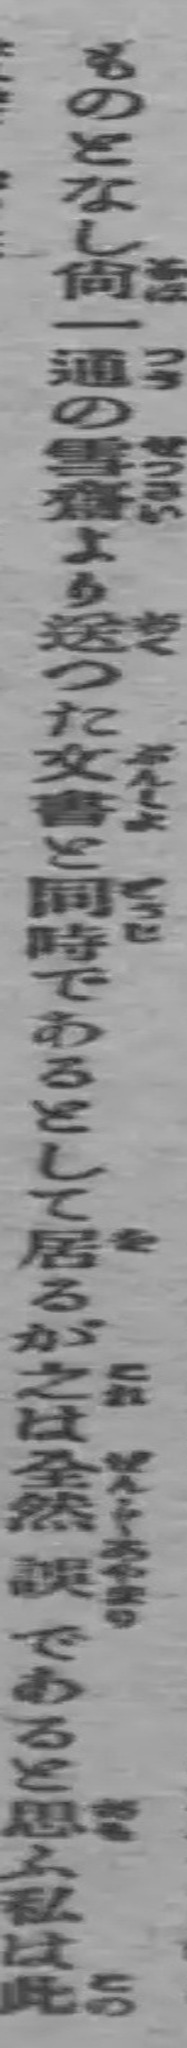ものとなし尚一通の雪斎より送つた文書と同時であるとして居るが之は全然誤であると思ふ私は此
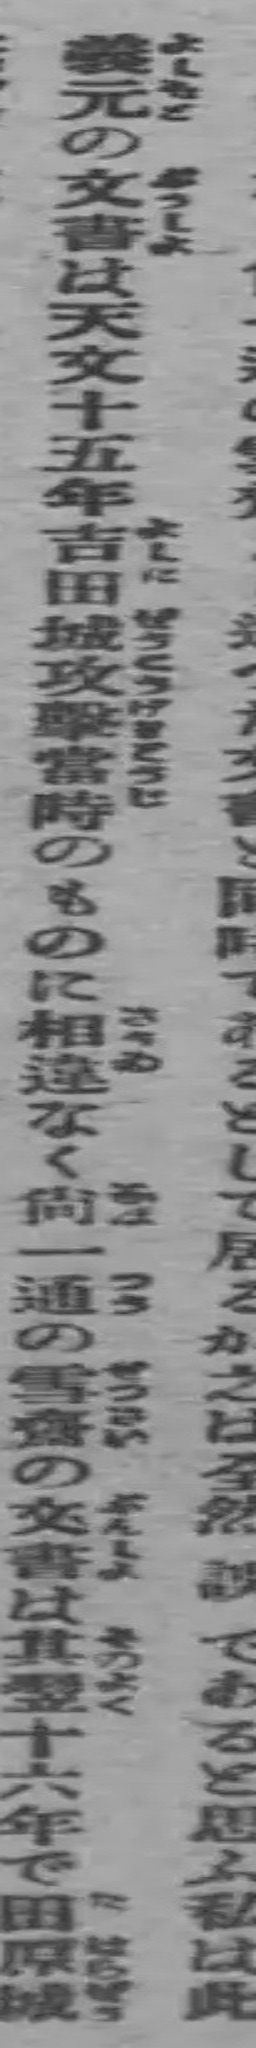義元の文書は天文十五年吉田城攻撃当時のものに相違なく尚一通の雪斎の文書は其翌十六年で田原城
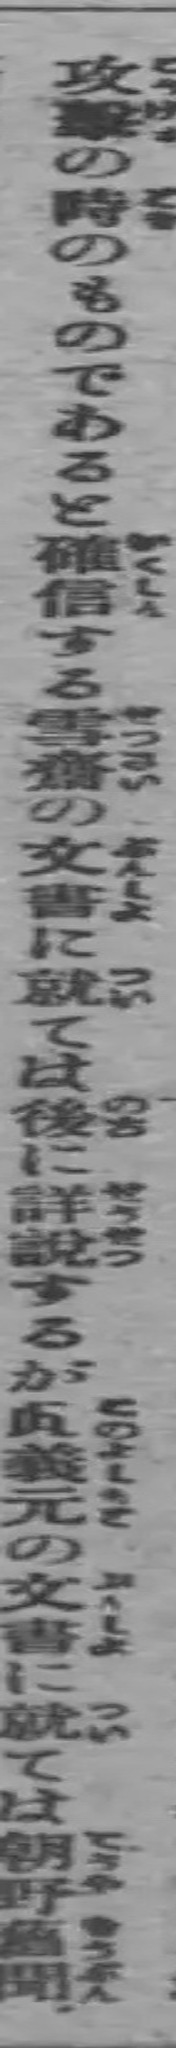攻撃の時のものであると確信する雪斎の文書に就ては後に詳説するが此義元の文書に就ては朝野旧聞
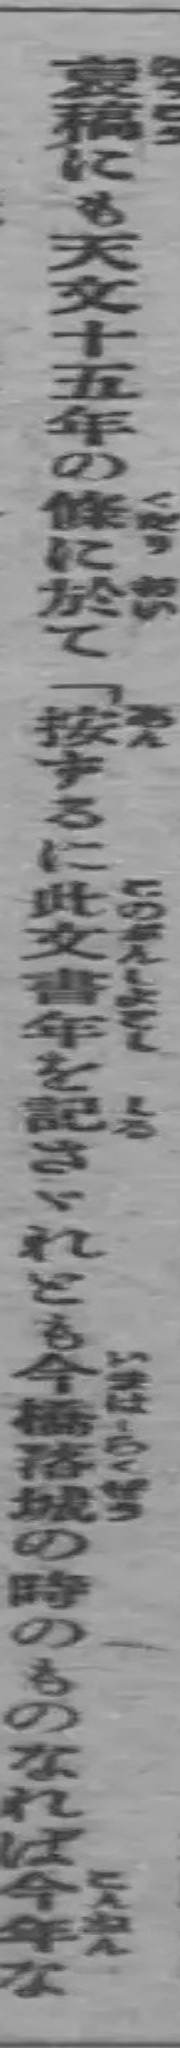裒考にも天文十五年の条に於て「按ずるに此文書年を記さゞれとも今橋落城の時のものなれば今年な
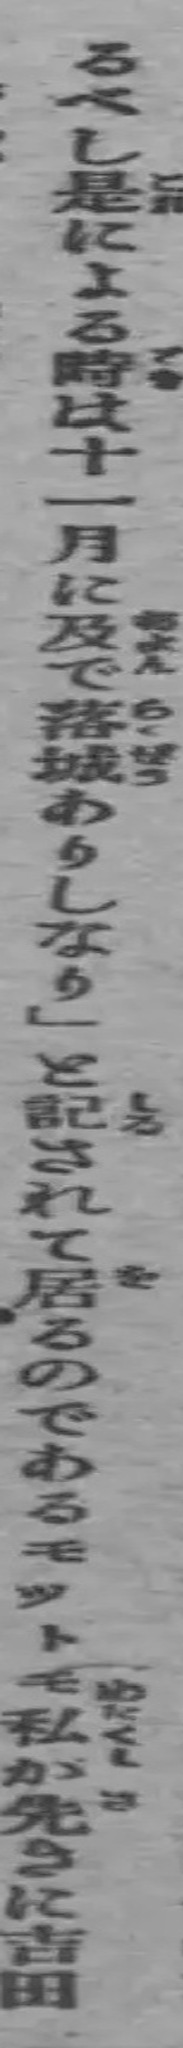るべし是による時は十一月に及で落城ありしなり」と記されて居るのであるモツトモ私が先きに吉田
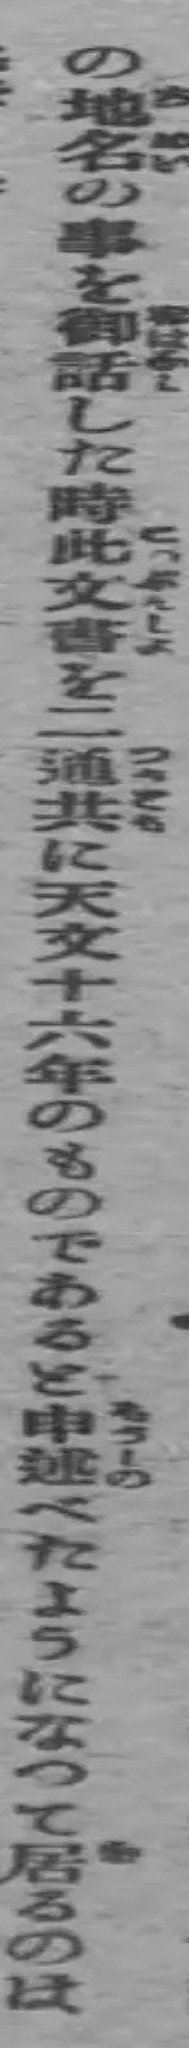の地名の事を御話した時此文書を二通共に天文十六年のものであると申述べたようになつて居るのは
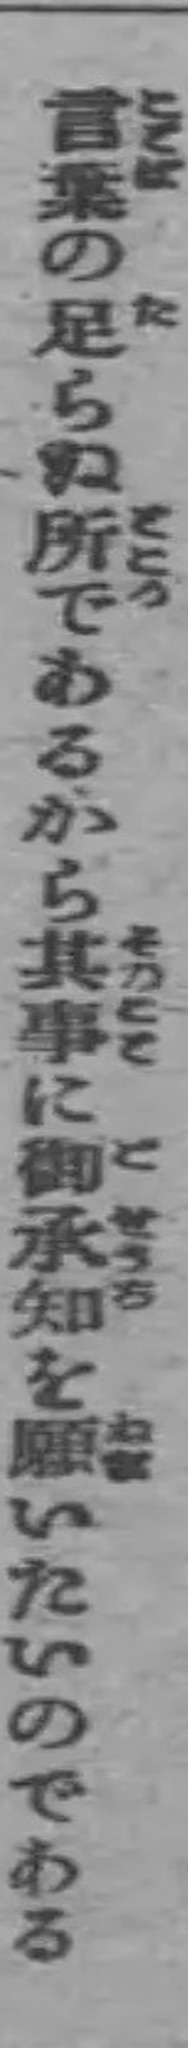言葉の足らぬ所であるから其事に御承知を願いたいのである
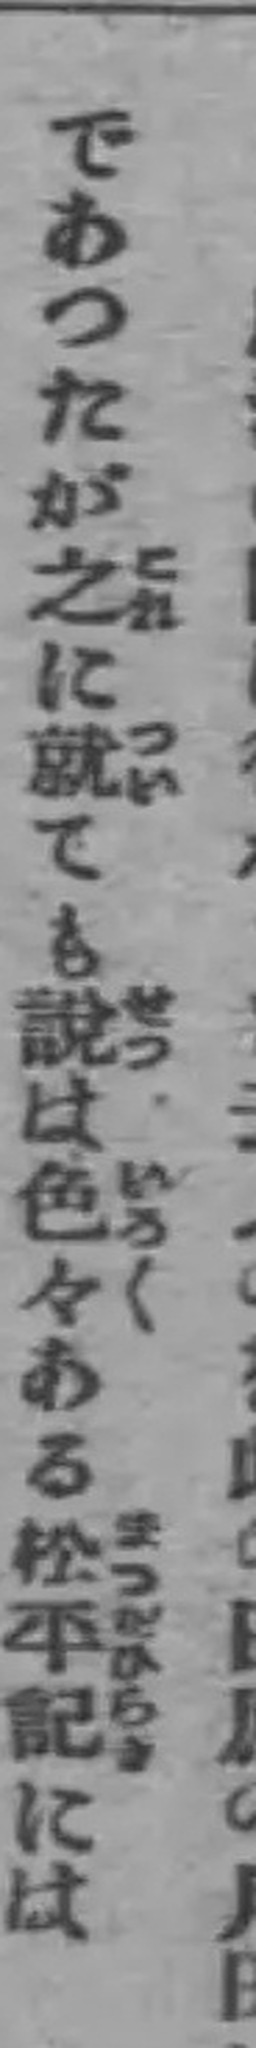であつたが之に就ても説は色々ある松平記には
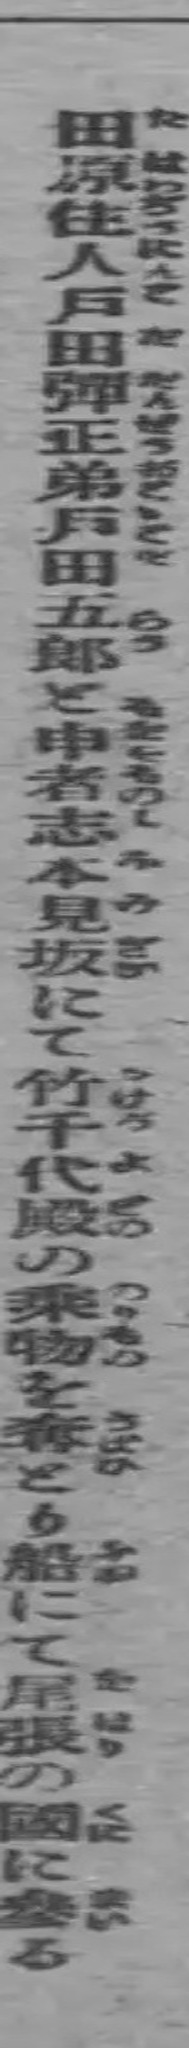田原住人戸田弾正弟戸田五郎と申者志本見坂にて竹千代殿の乗物を奪とり船にて尾張の国に参る
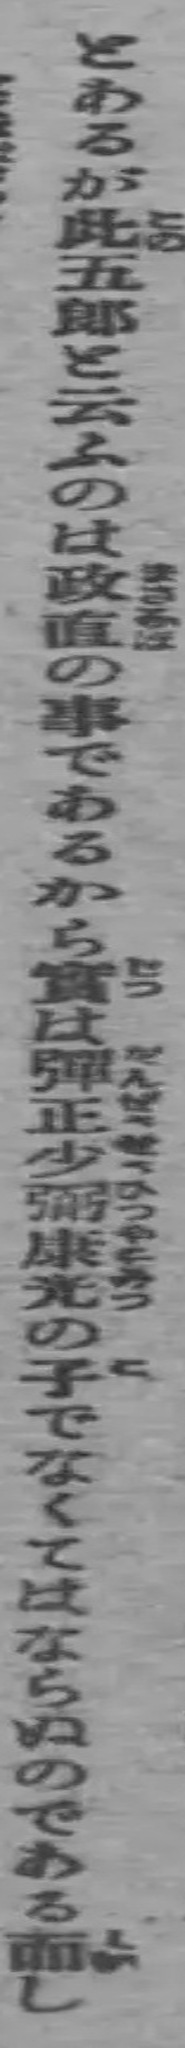とあるが此五郎と云ふのは政直の事であるから実は弾正少弼康光の子でなくてはならぬのである而し
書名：豊橋市史談
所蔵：国立国会図書館 National Diet Library, JAPAN
